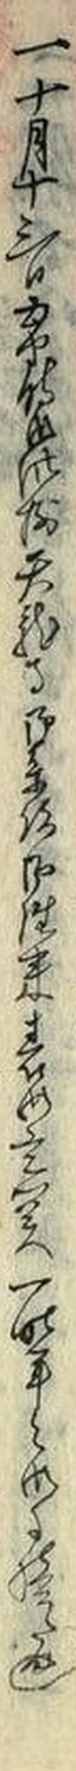一十月十三日五半時御供揃天龍寺御参詣御往来表御玄関一昨年之御手続之通
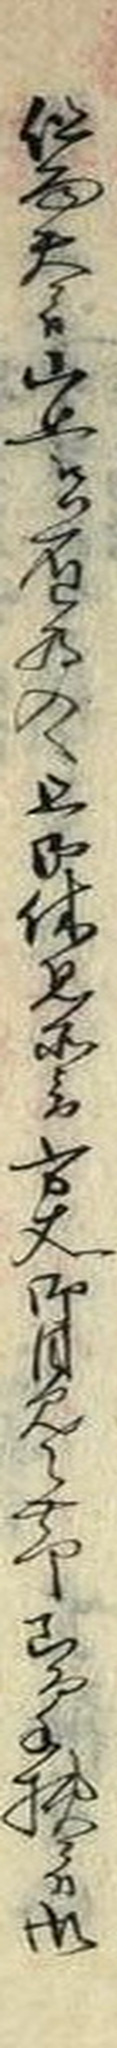但雨天ニ付山上江ハ不被為入候且御休息所ニ而方丈御目見之節至而手狭ニ付御
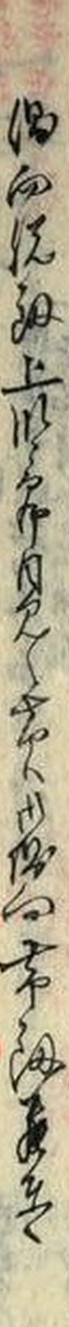側向脱剣上段ニ而御目見之節ハ御側向帯剣罷在候
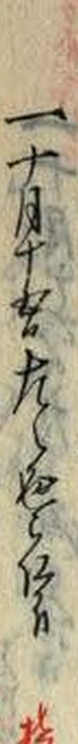一十月十五日左之通被仰付

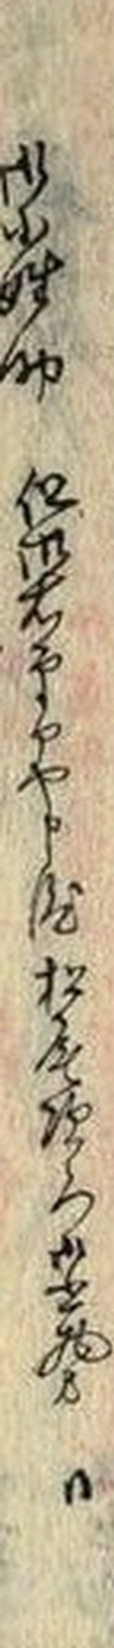御小姓助但御右筆部や申渡松尾次右衛門御書物方
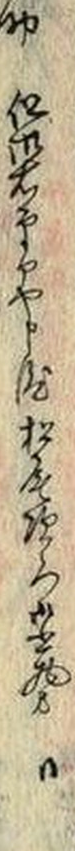御小姓助但御右筆部や申渡松尾次右衛門御書物方
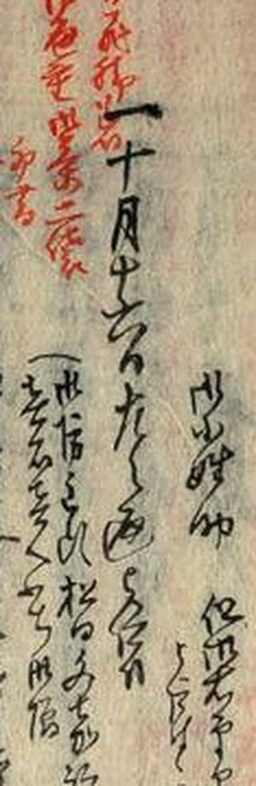一十月十六日左之通被仰付
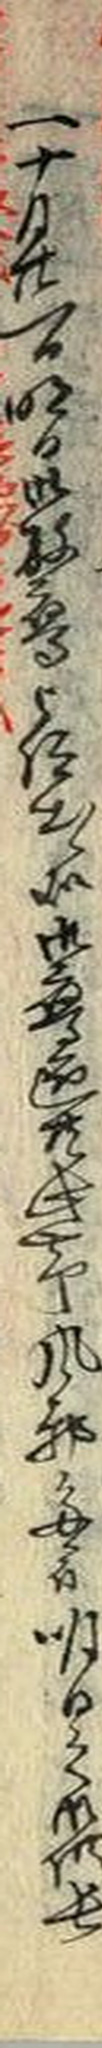一十月廿一日明日御放鷹被仰出候処御鷹匠共此節風邪多ニ付明日之御供長
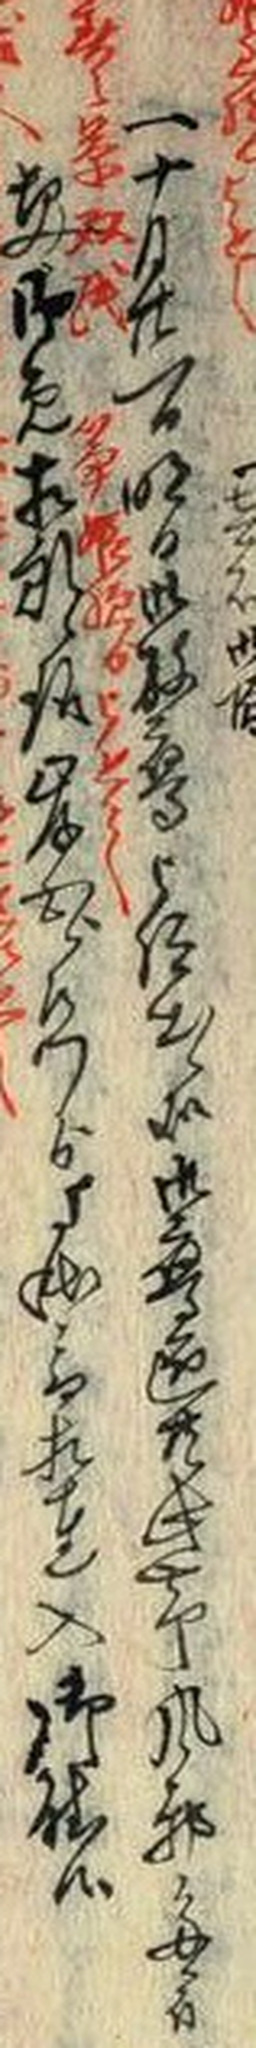髪御免相願候趣岸五郎左衛門ゟ手紙ニ而相達入御聴候
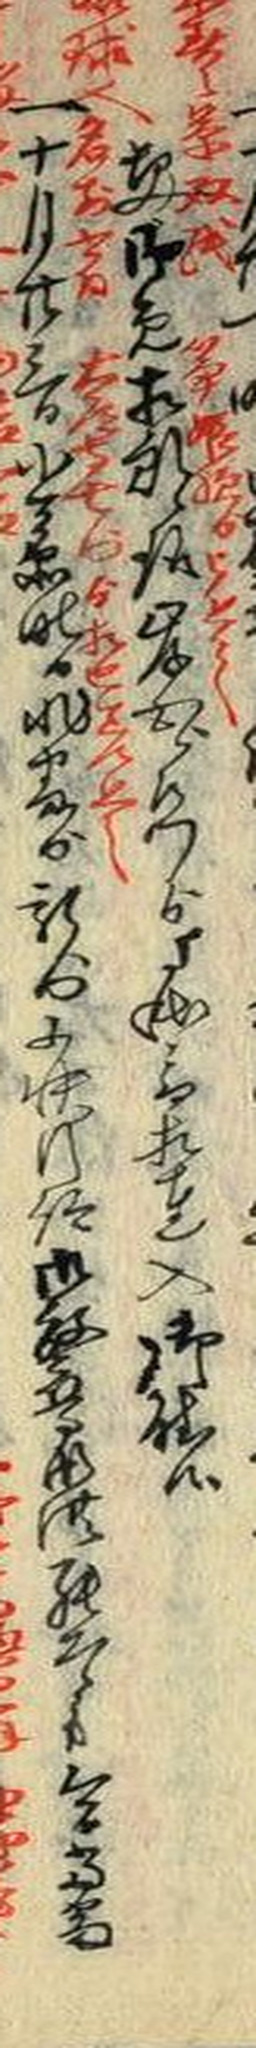一十月廿三日小兵衛昨日非番ゟ新右衛門不快引跡御放鷹御供罷出候ニ付今日当番
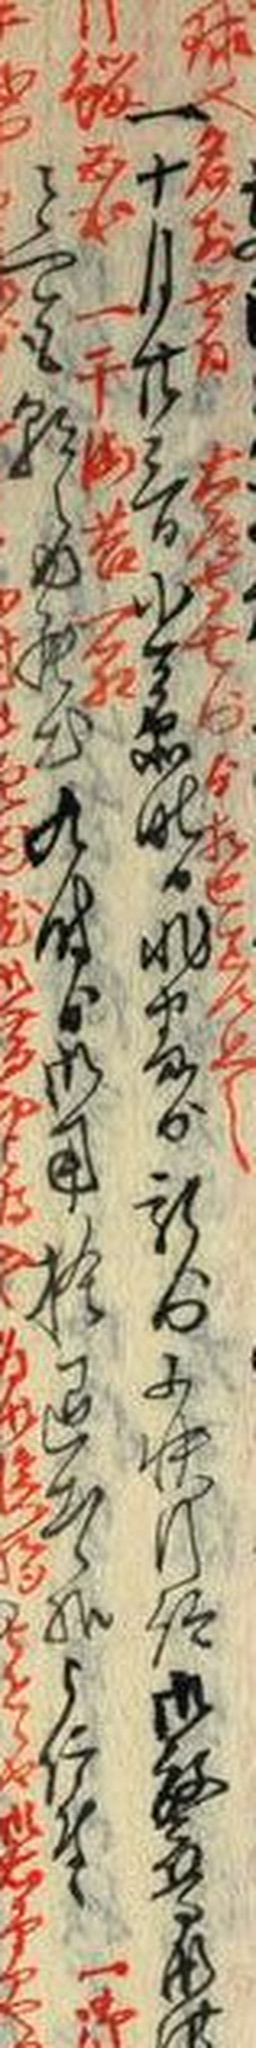ニ候へとも朝之内罷出九時ゟ御用捨退出候様被仰付候
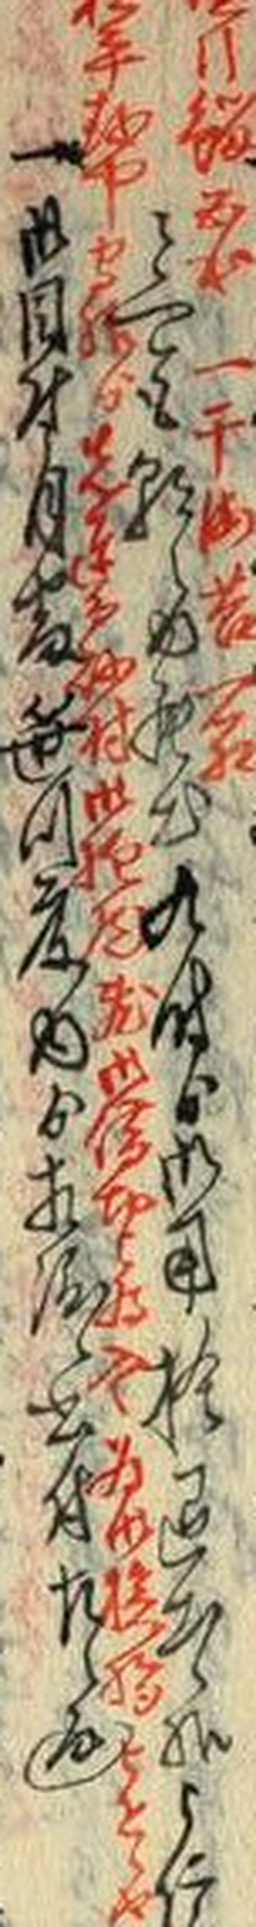一御目付月番笹川藤内ゟ相渡候書付左之通
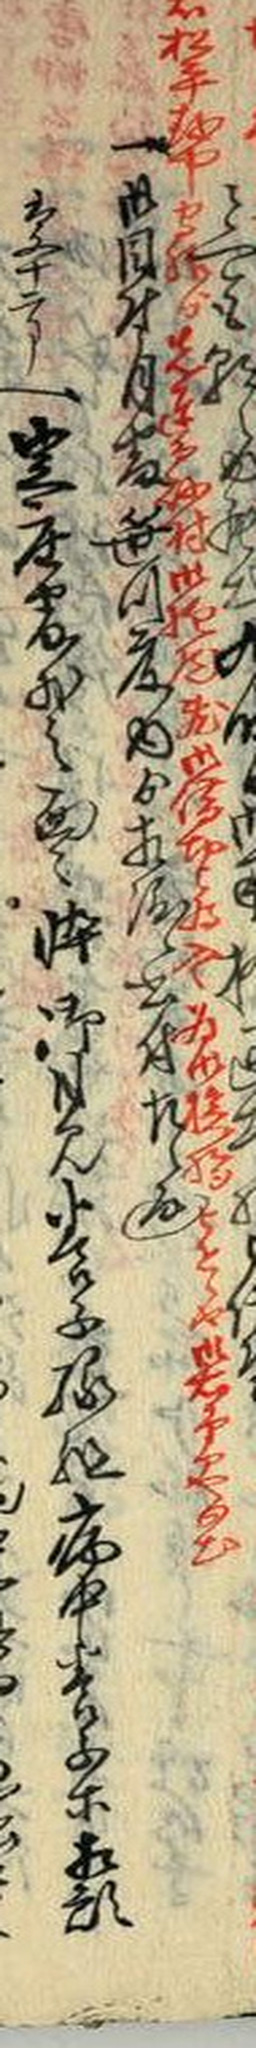尚又十二月定座番外之面々忰御目見養子縁組病中養子等相願
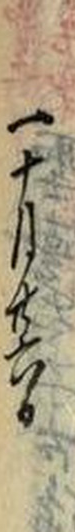一十月廿六日
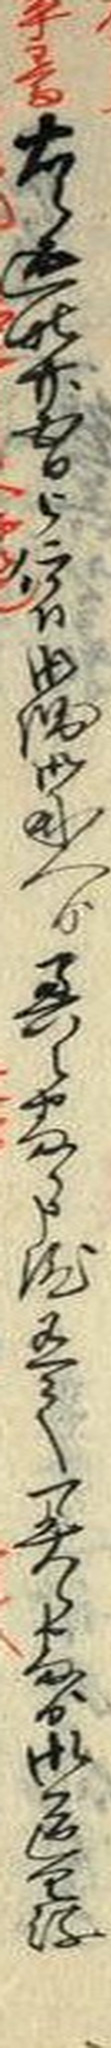右之通昨廿五日被仰付御側御用人ゟ奥之番へ申渡有之奥之番ゟ御道具役
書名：少傅日録抄（斉承付側向頭取日記、在国）
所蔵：福井県文書館 Fukui Prefectural Archives
